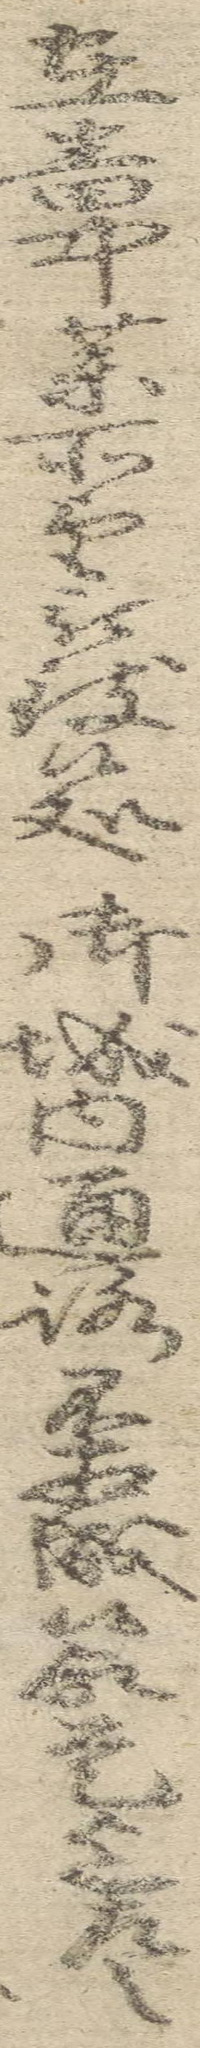在番中薬所望被致候処御城内通路不相成候故是迄左之
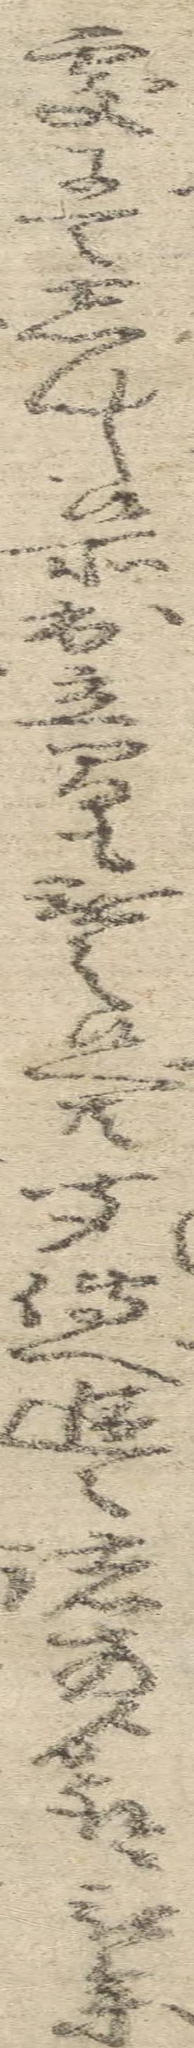處にてしんし候所出立間も無之候へ共聞伝へ追々諸方ゟ取ニ被参
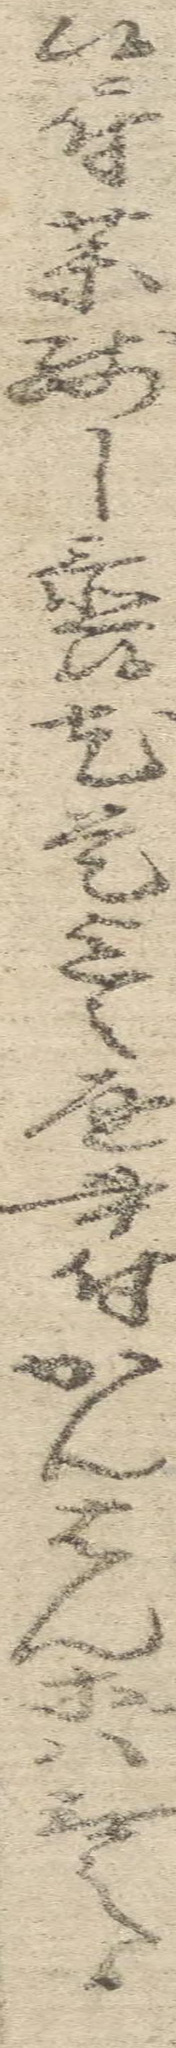候に付薬残し置候尤是迄之通書付かんはん等は無之候
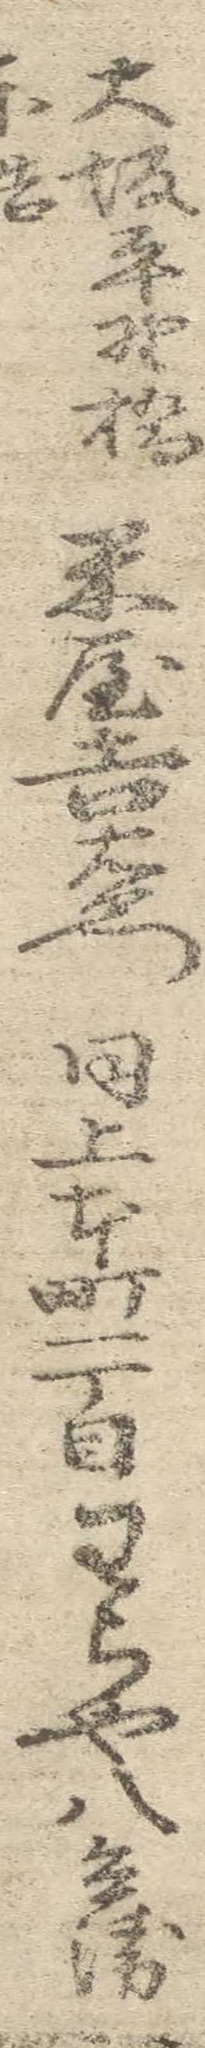大坂平野橋東詰米屋吉右衛門同上本町一丁目わらや八兵衛
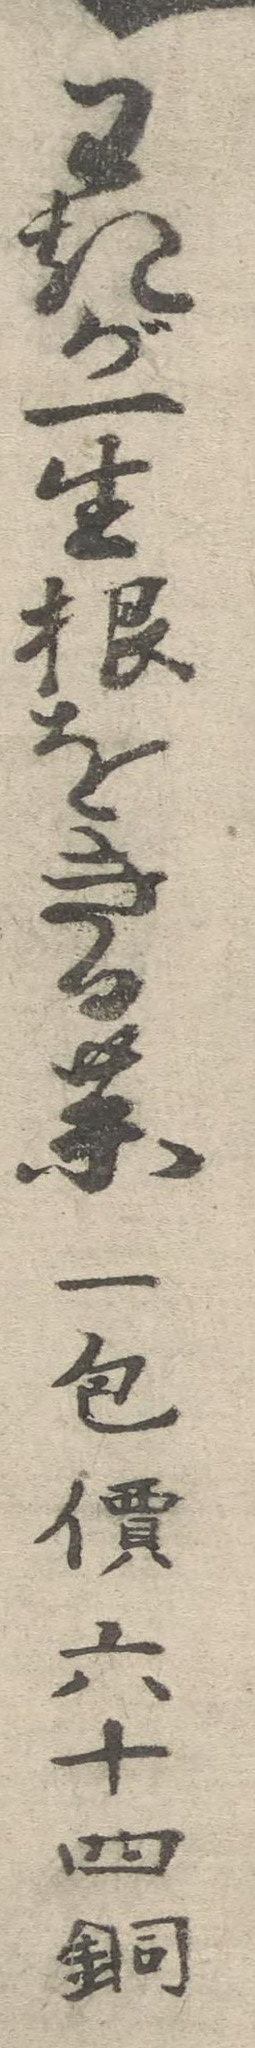わきが一生根をきる薬一包価六十四銅

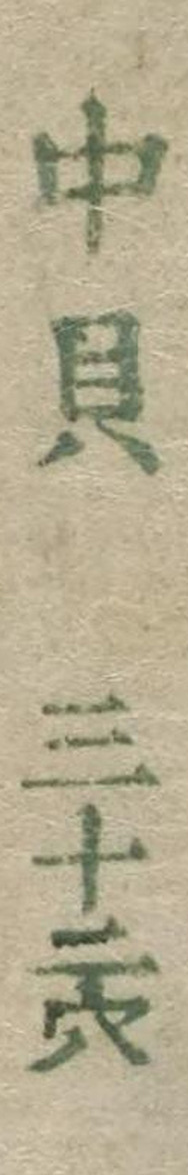中貝三十二穴
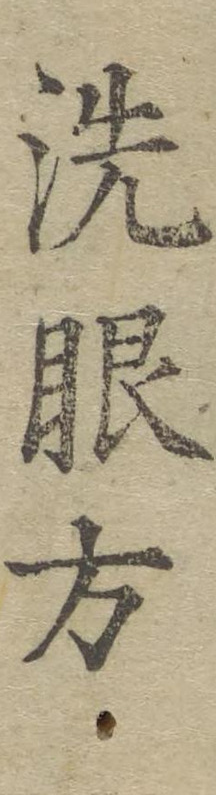洗眼方
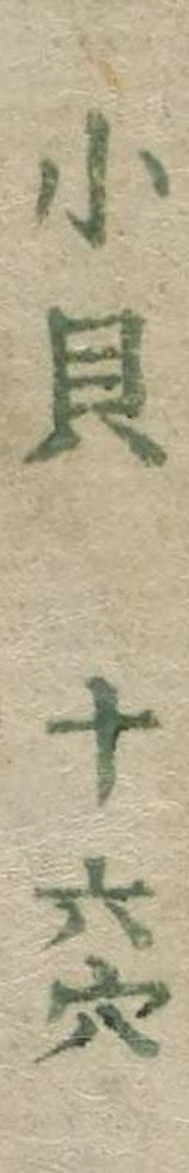小貝十六穴
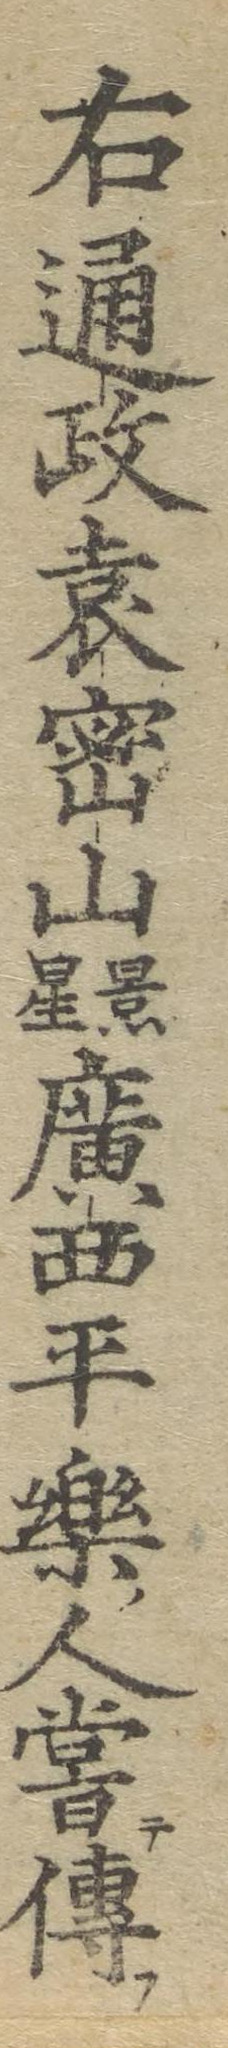右通政袁密山景星広西平楽人甞傳
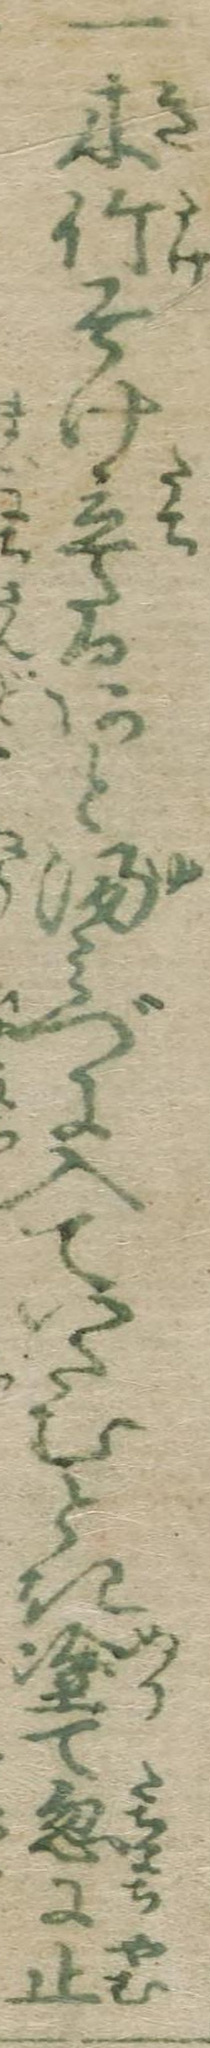一木竹そけ立たるあと湯みづに入ていたむとき塗て忽に止
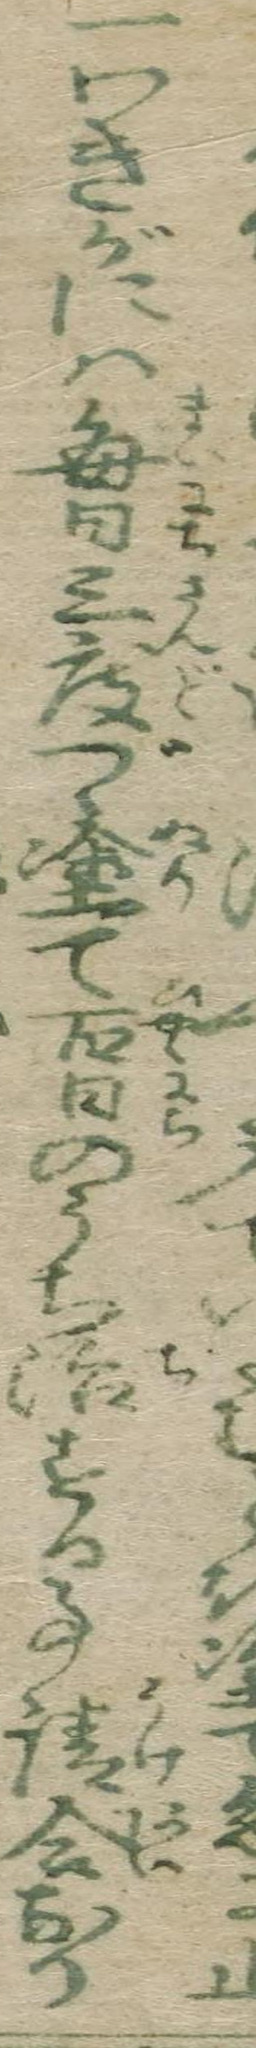一わきがには毎日三度づゝ塗て百日のうち治する事請合なり
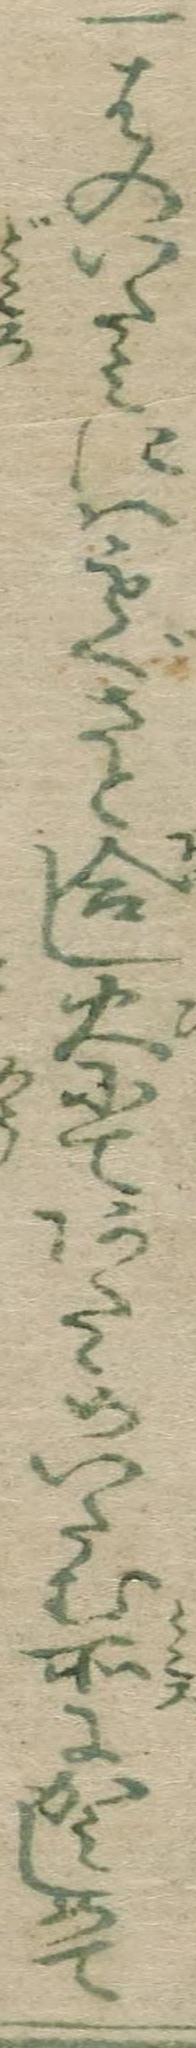一はのいたみにはもぐさと合し火にてあたゝめいたむ所にかみしめて
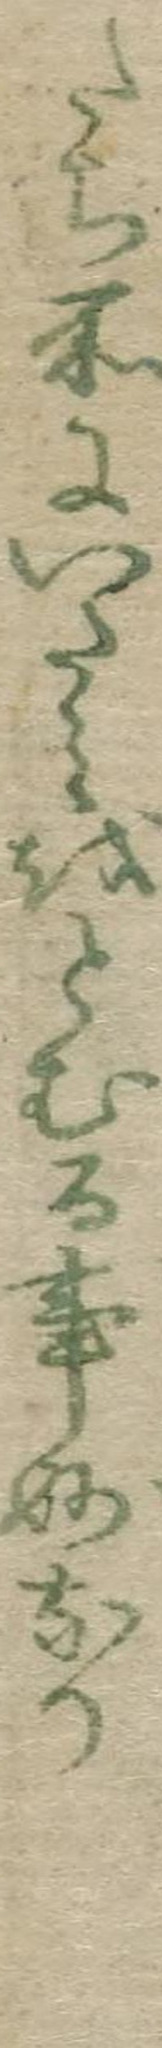たち所にいたみをとむる事妙なり
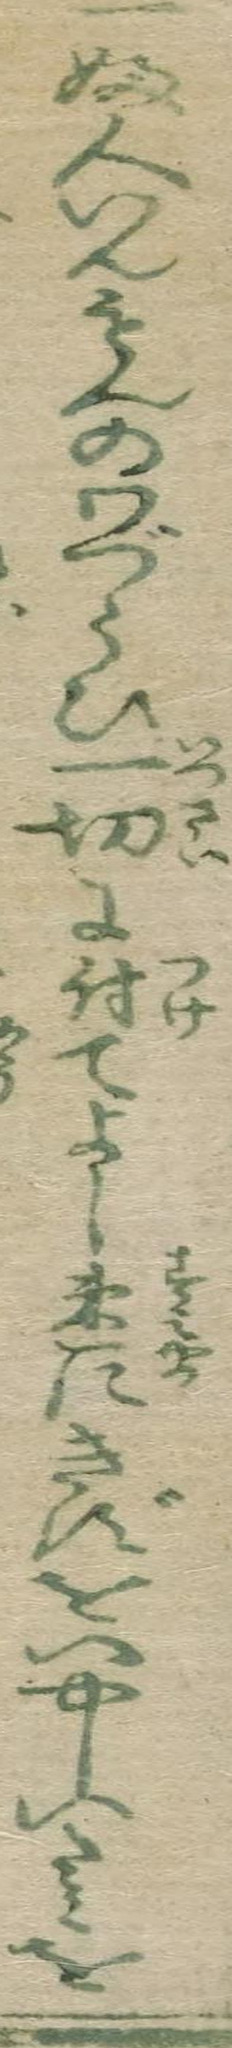一婦人いんもんのわづらひ一切に付てよし速にきずをいやしいたみを
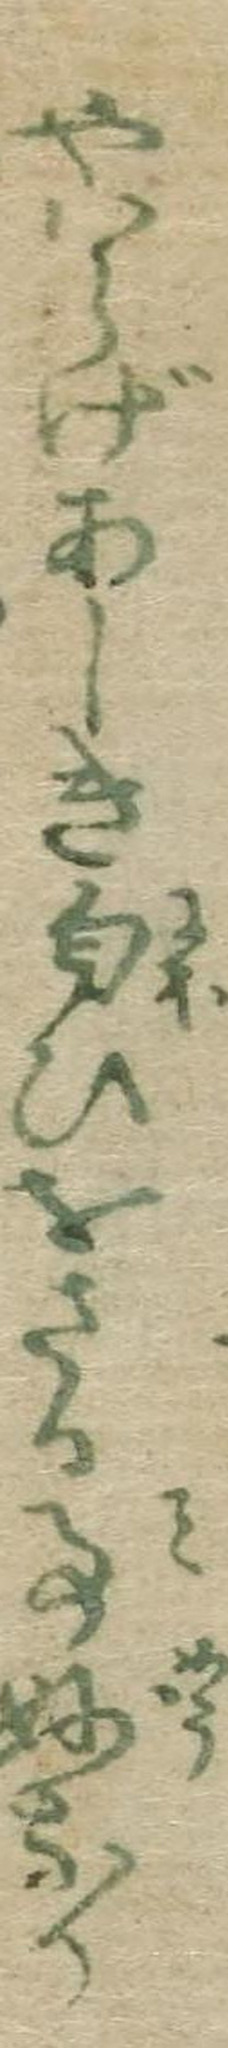やはらげあしき匂ひをさる事妙なり
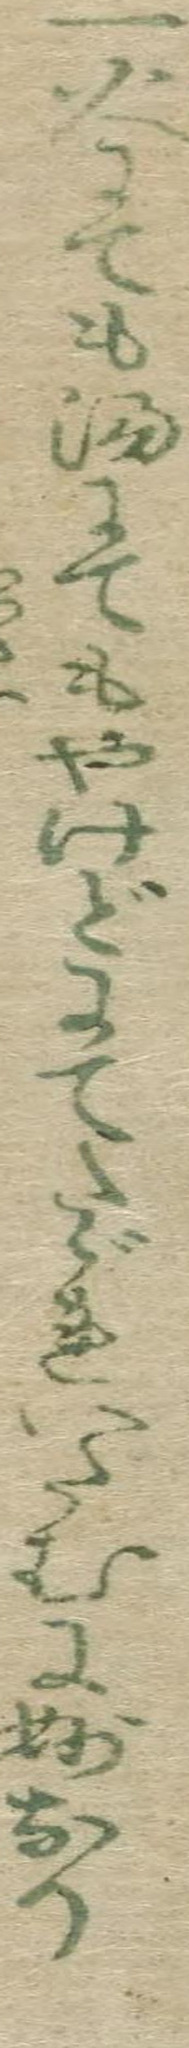一火にても湯にてもやけどにてたゞれいたむに妙なり
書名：浪華薬種問屋能書張交帖. 二
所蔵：国立国会図書館 National Diet Library, JAPAN
